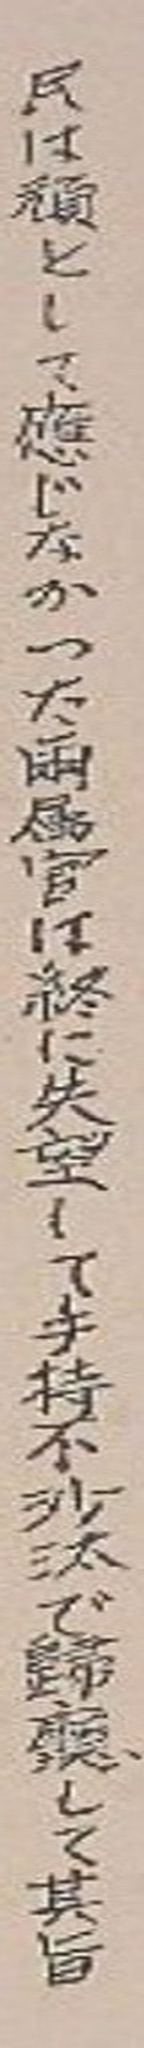民は頑として応じなかつた両属官は終に失望して手持不沙汰で帰庁して其旨
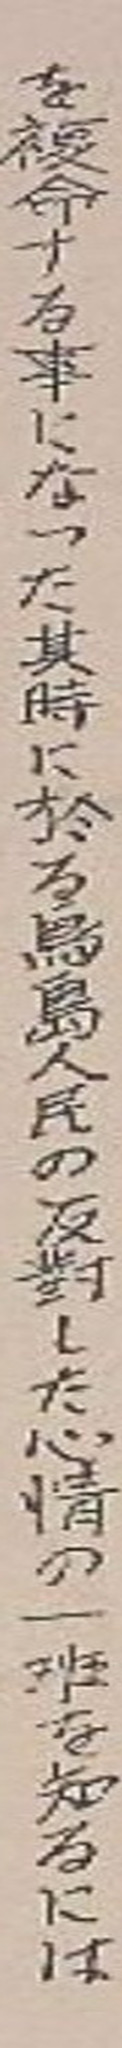を復命する事になつた其時に於る鳥島人民の反対した心情の一班を知るには
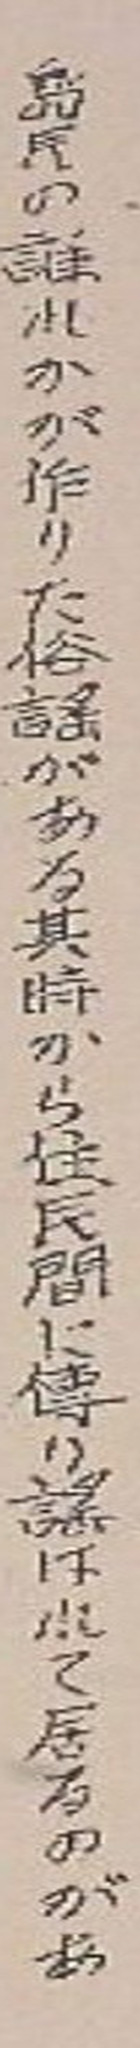島民の誰れかが作りた俗謡がある其時から住民間に伝り謡はれて居るのがあ
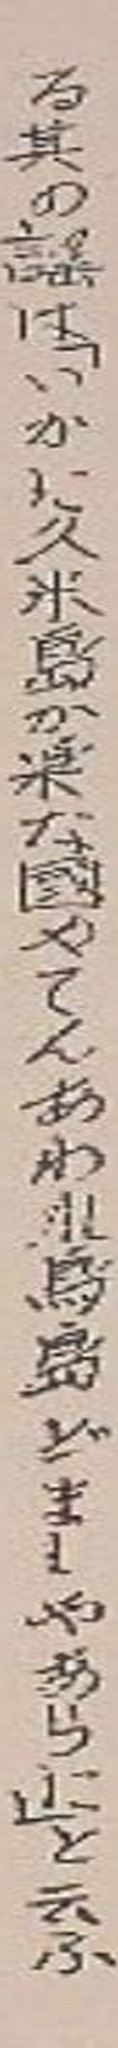る其の謡は「いかに久米島か楽な国やてんあわれ鳥島どましやあらに」と云ふ
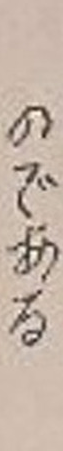のである
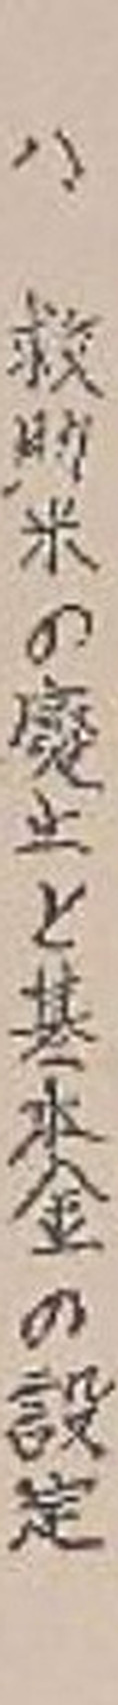ハ．救助米の廃止と基本金の設定
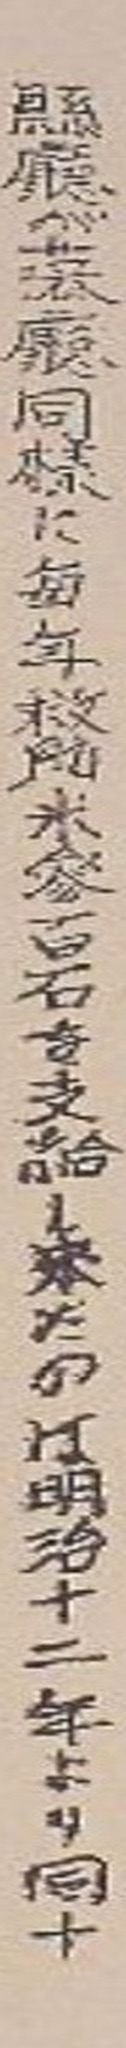県庁が藩庁同様に毎年救助米参百石を支給し来たのは明治十二年より同十
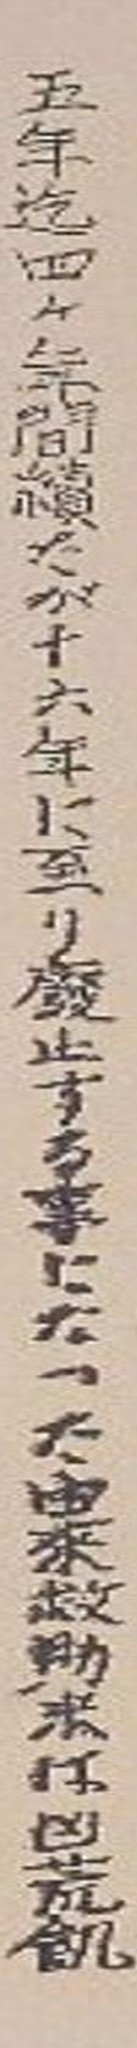五年迄四ヶ年間続たが十六年に至り廃止する事になつた由来救助米は凶荒飢
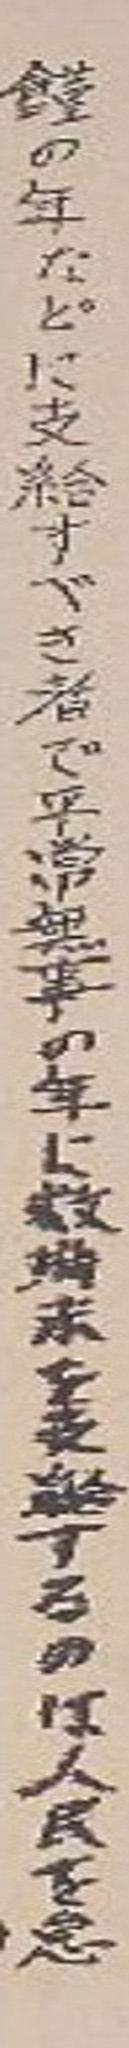饉の年などに支給すべき者で平常無事の年に救助米を支給するのは人民を怠
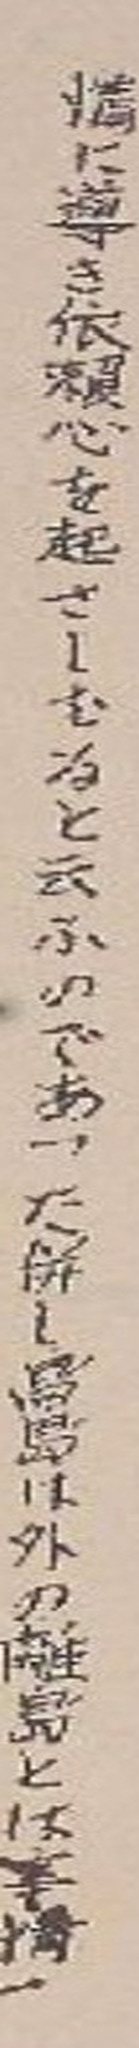惰に導き依頼心を起さしむると云ふのであつた併し鳥島は外の離島とは事情一
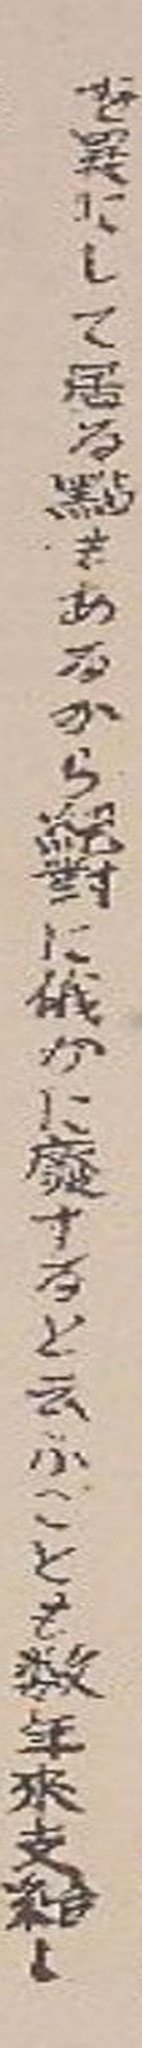を異にして居る点もあるから絶対に俄かに廃すると云ふことも数年来支給し
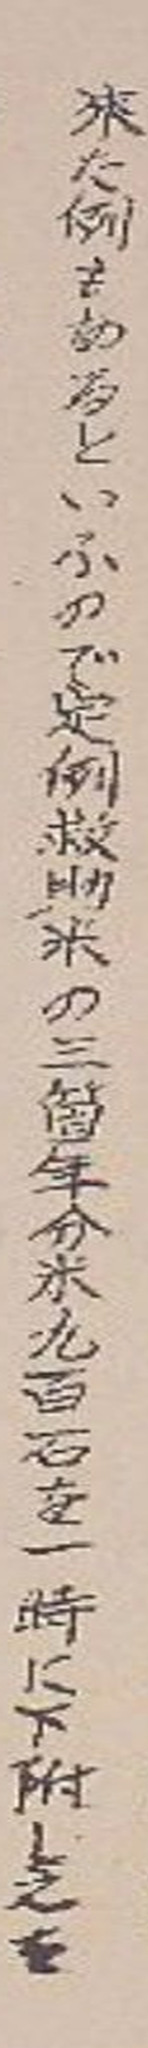来た例もあるといふので定例救助米の三箇年分米九百石を一時に下附し之を
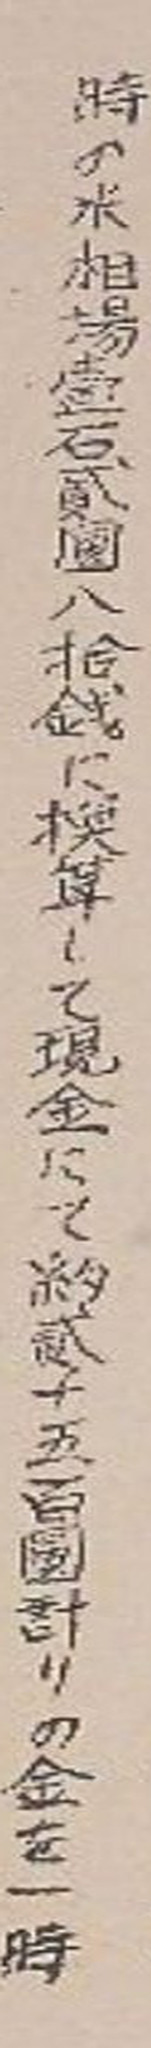時の米相場壱石弐円八拾銭に換算して現金にて約弐千五百円計りの金を一時
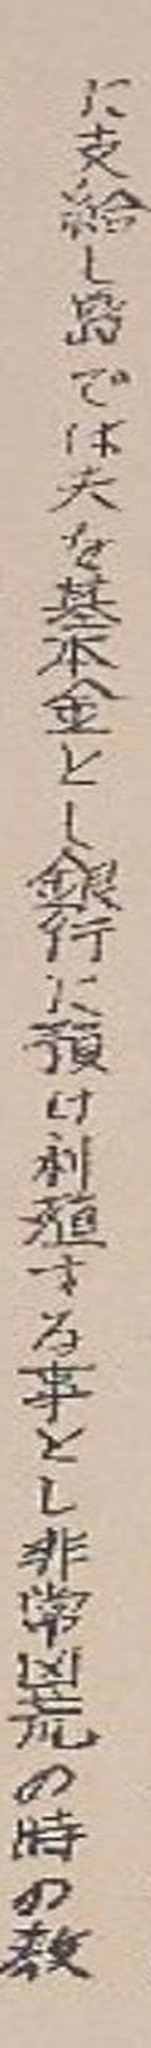に支給し島では夫を基本金とし銀行に預け利殖する事とし非常凶荒の時の教
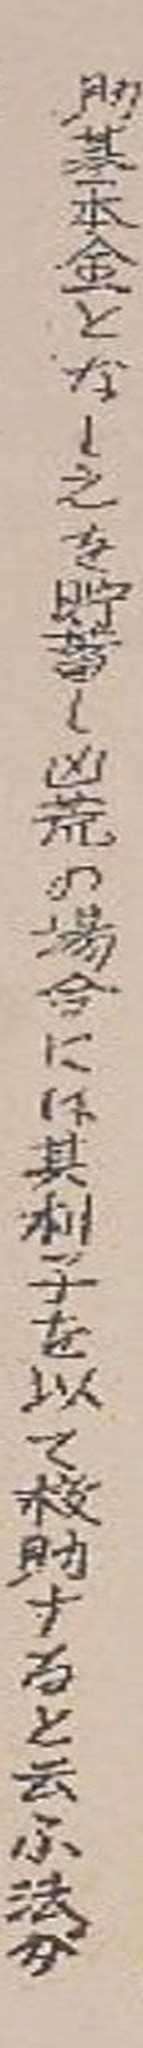助基本金となし之を貯蓄し凶荒の場合には其利子を以て救助すると云ふ法が
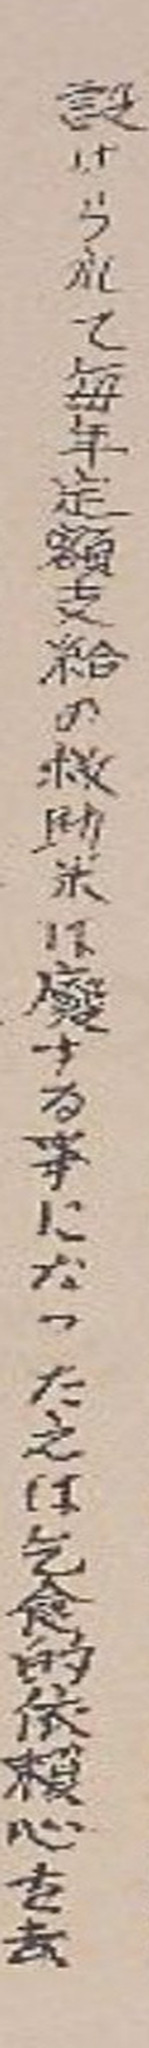設けられて毎年定額支給の救助米は廃する事になった之は乞食的依頼心を去
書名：鳥島移住始末
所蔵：University of the Ryukyus Library
